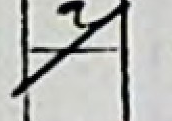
7
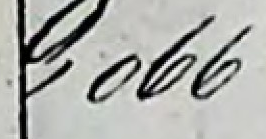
0,066
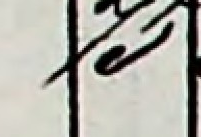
75
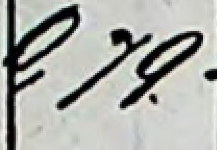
0,79
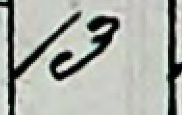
13
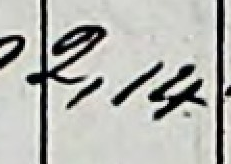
2,14
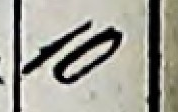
10
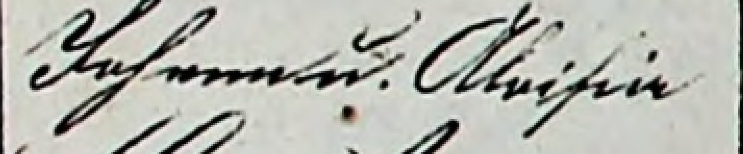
Johann u. Aloisia
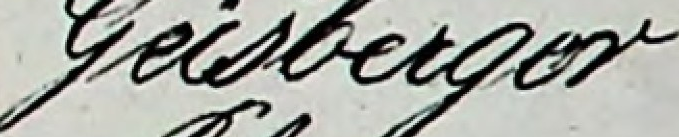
Geisberger
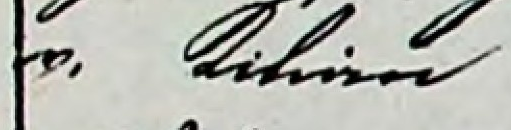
v. Kilian
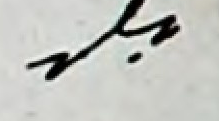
do
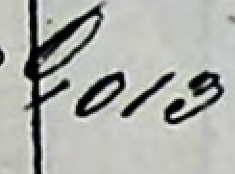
0,013
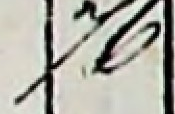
76
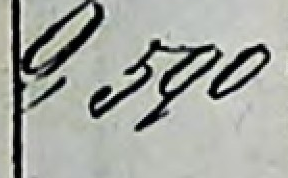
0,590
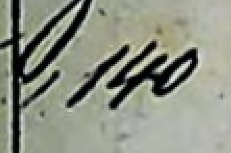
0,140
